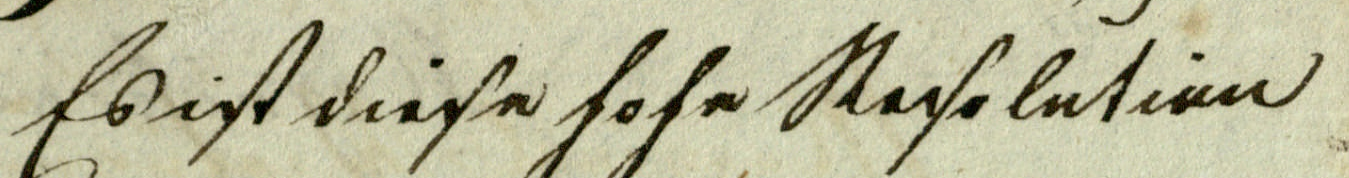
Es ist diese hohe Resolution
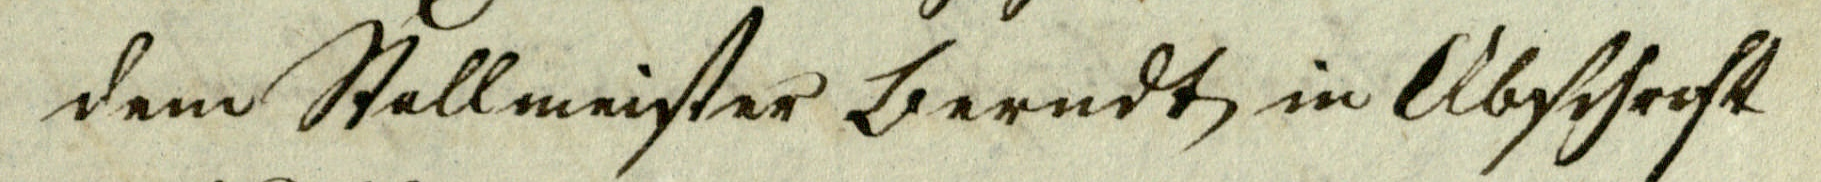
dem Stallmeister Berndt in Abschrift
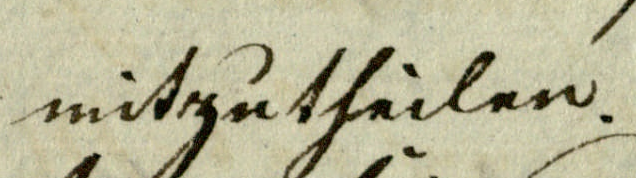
mitzutheilen.
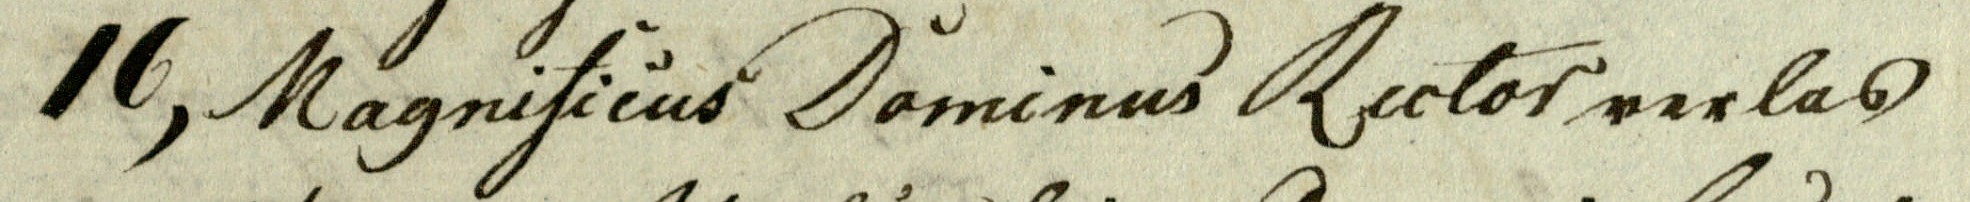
16, Magnificus Dominus Rector verlas
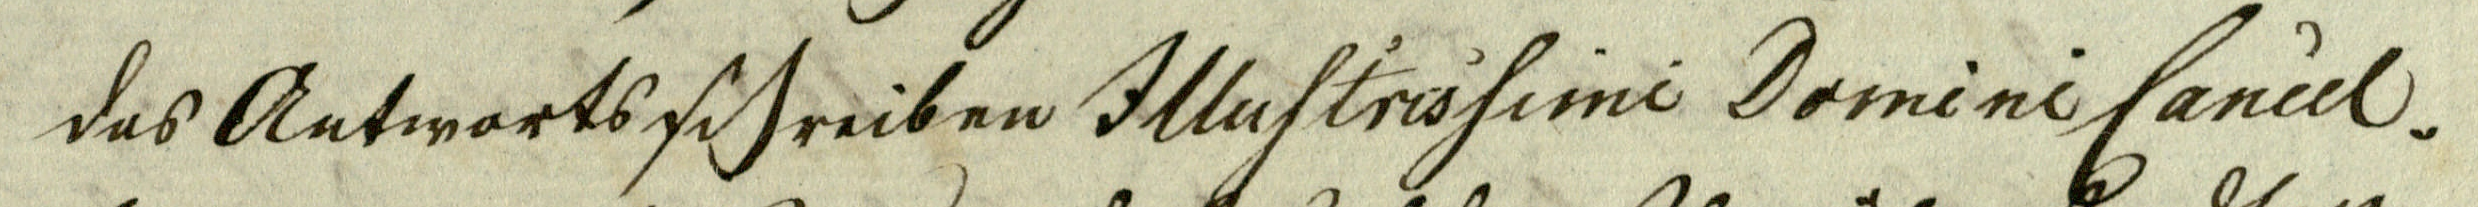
das Antwortschreiben Illustrissimi Domini Cancel¬
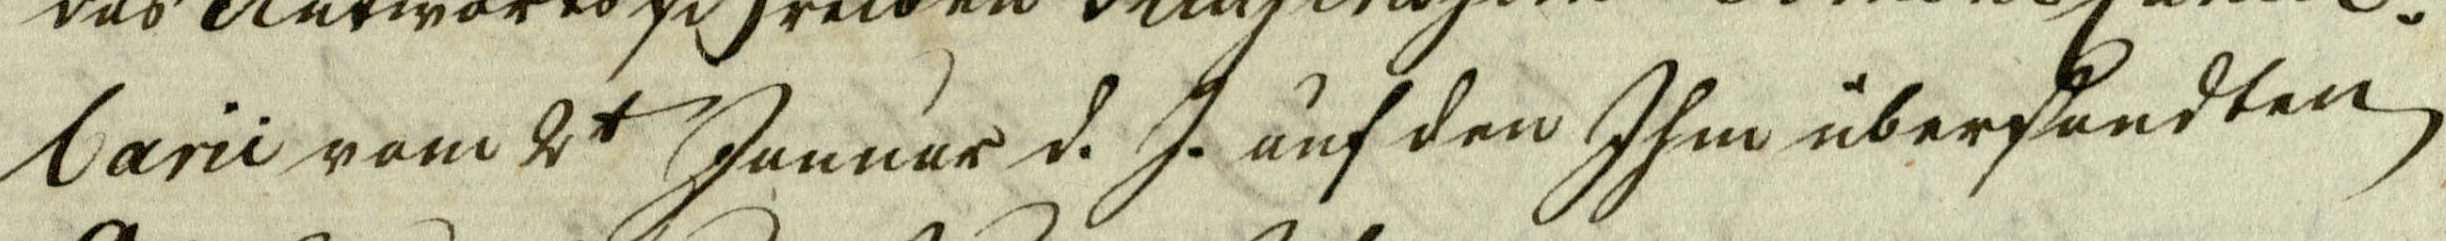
larii vom 2ten Januar d. J. auf den Ihm übersandten
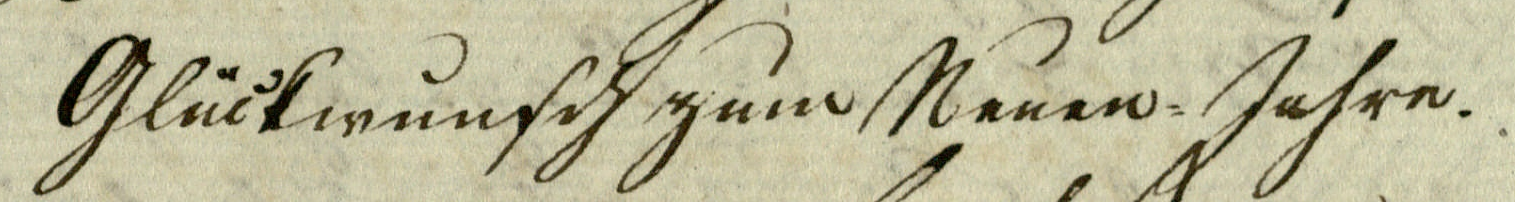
Glückwunsch zum Neuen Jahre.
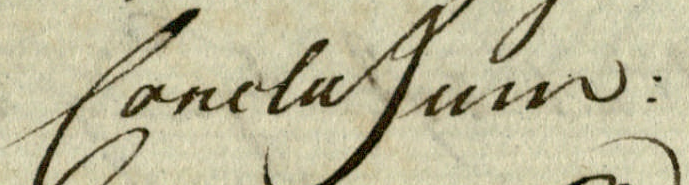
Conclusum:
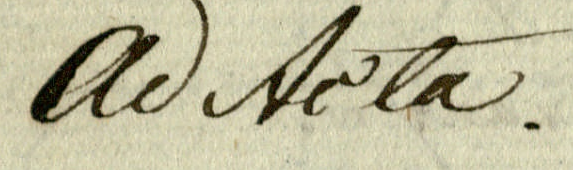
Ad Acta.
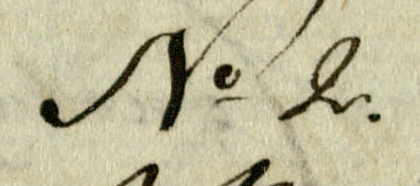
Nº 2.
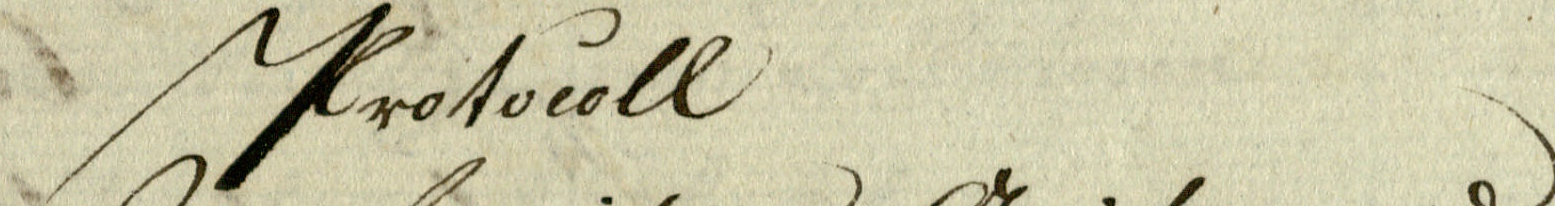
Protocoll
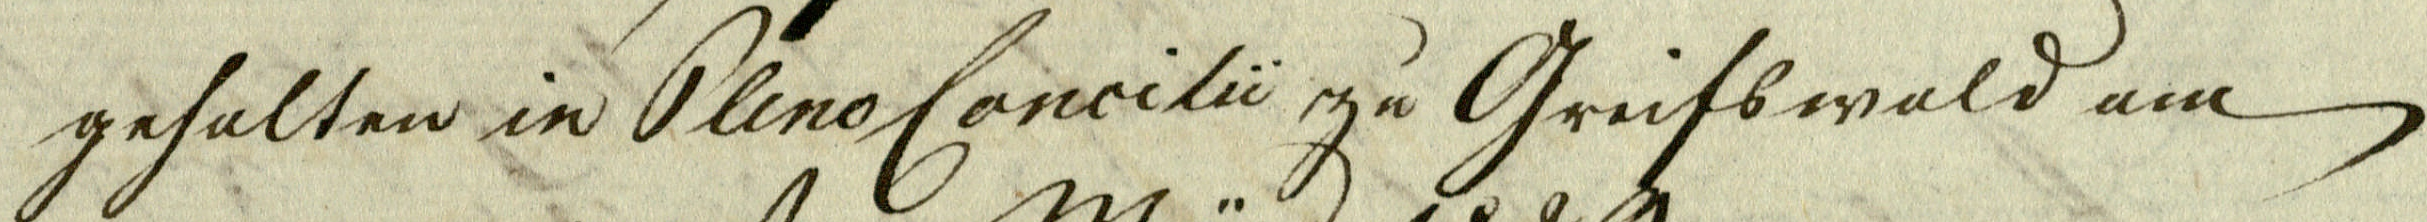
gehalten in Pleno Concilii zu Greifswald am
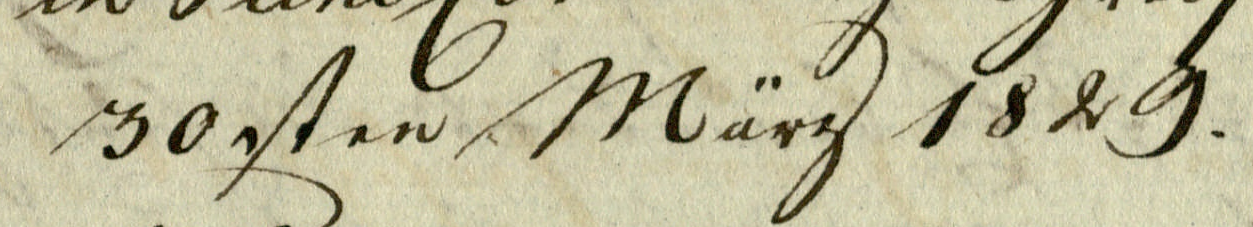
30sten März 1829.
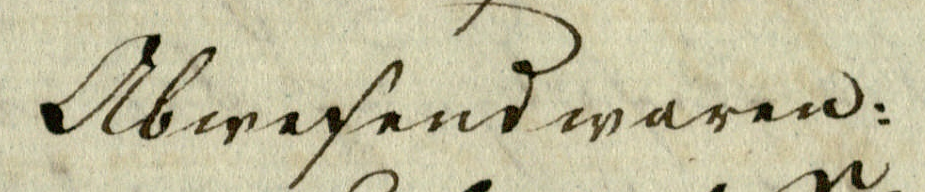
Abwesend waren:
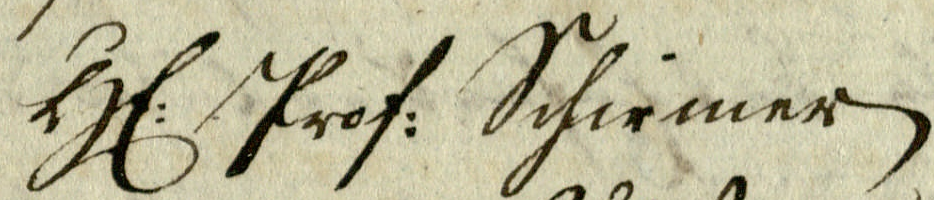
HE: Prof: Schirmer,
